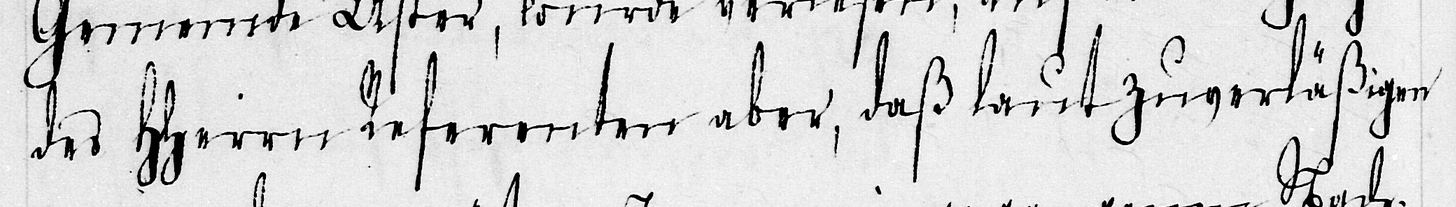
des HHerrn Referenten aber, daß laut zuverläßigen
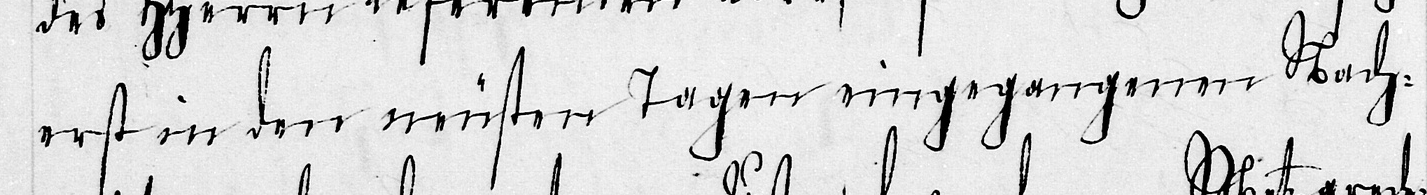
erst in den neusten Tagen eingegangenen Nach¬
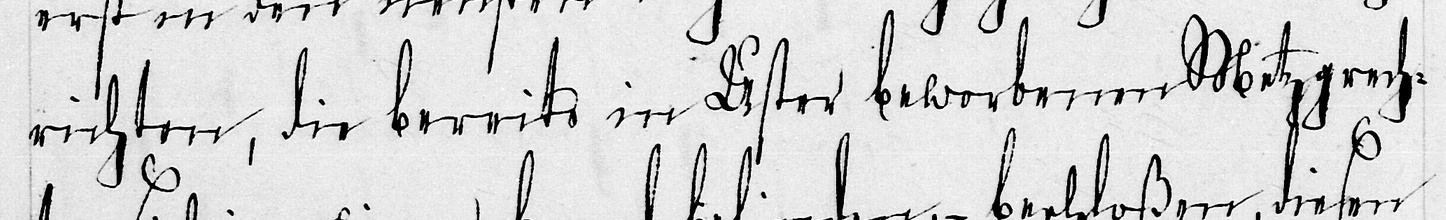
richten, die bereits in Uster beworbenen Metzgrech¬
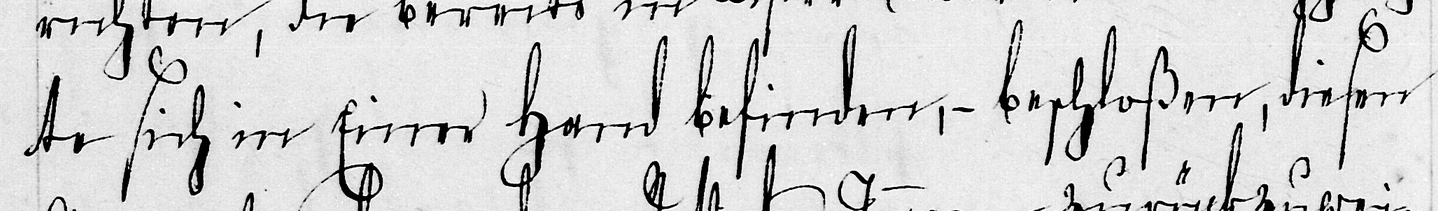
te sich in Einer Hand befinden, – beschloßen, diesen
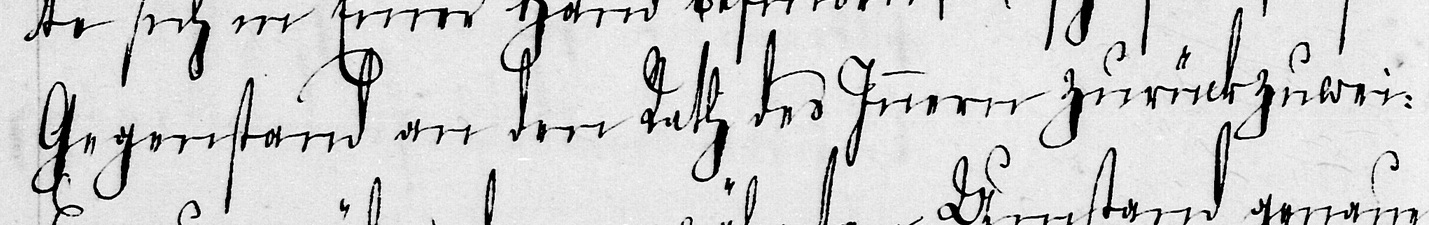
Gegenstand an den Rath des Innern zurückzuwei¬
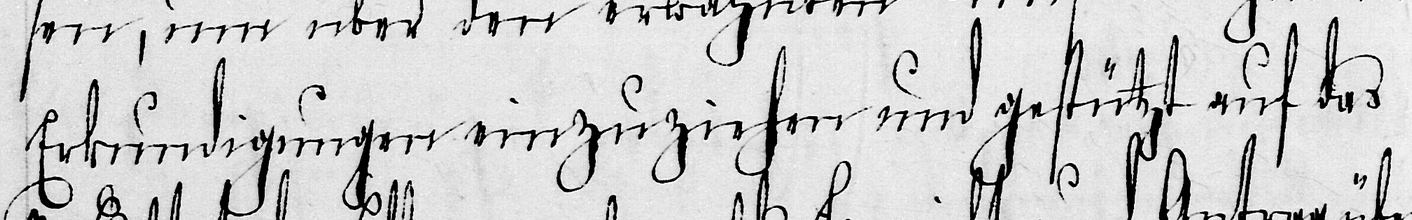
Erkundigungen einzuziehen und gestützt auf das
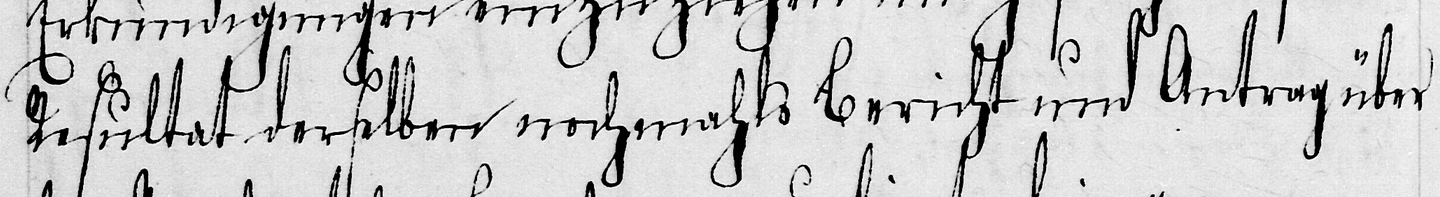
Resultat derselben nochmahls Bericht und Antrag über
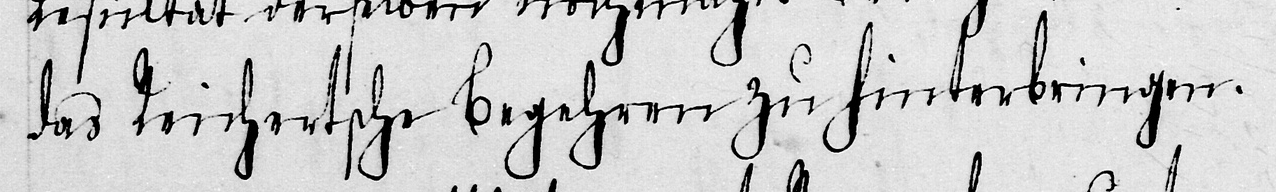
das Reichertsche Begehren zu hinterbringen.
